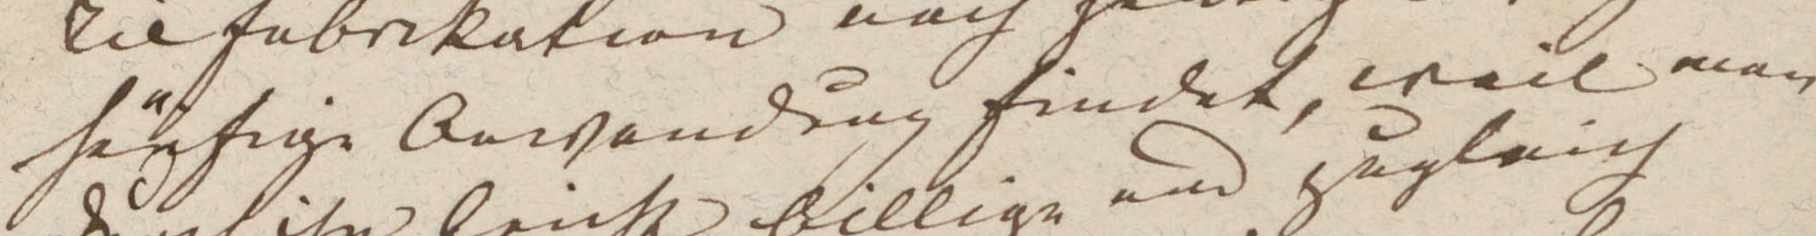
häufige Anwendung findet, weil man
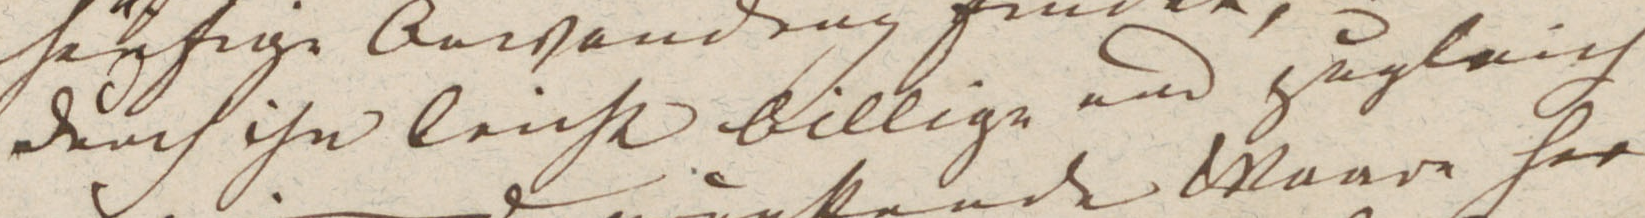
durch ihn leicht billige und zugleich
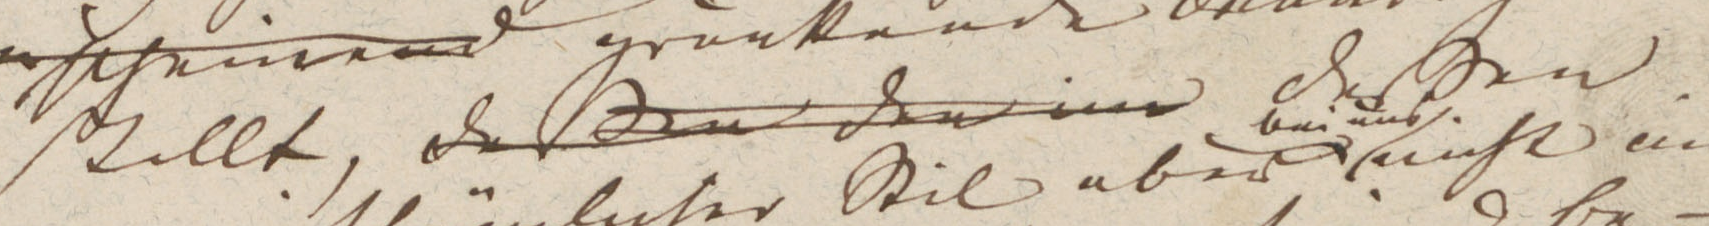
stellt, die den den im dessen
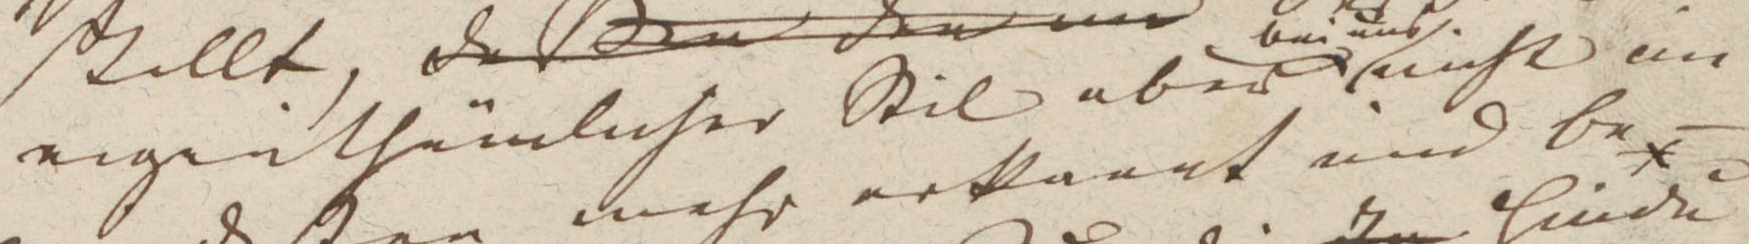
eigenthümlicher Stil aber bei uns nicht im
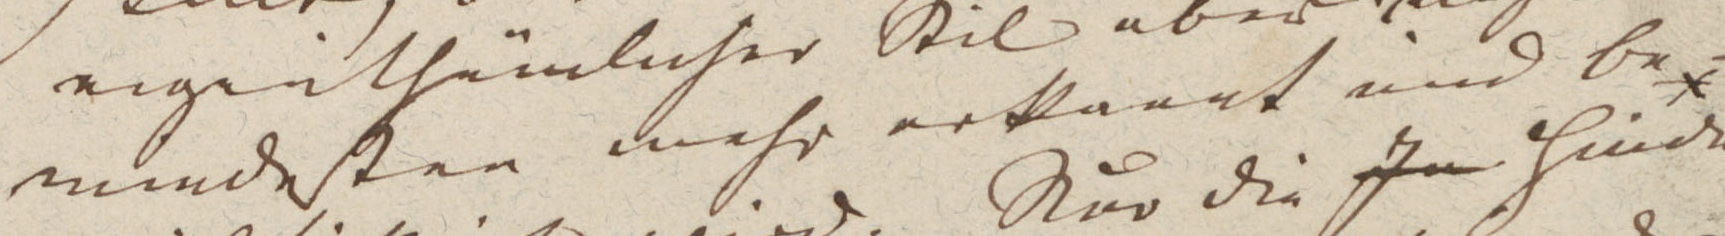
mindesten mehr erkannt und be-
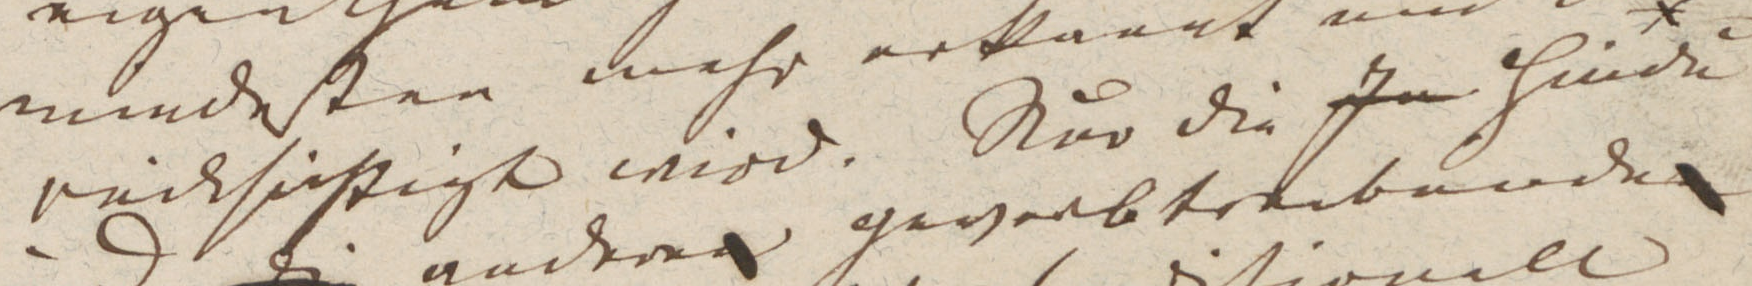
rücksichtigt wird. Nur die In Hindu %
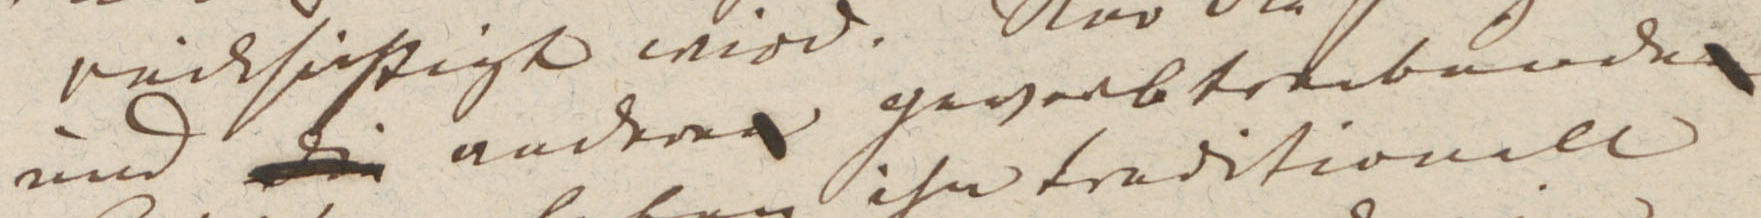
und die anderen gewerbtreibenden
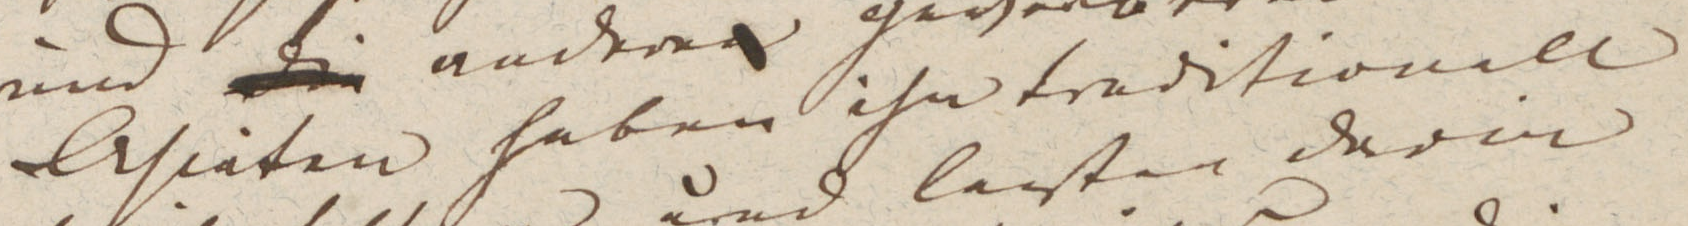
Asiaten haben ihn traditionell
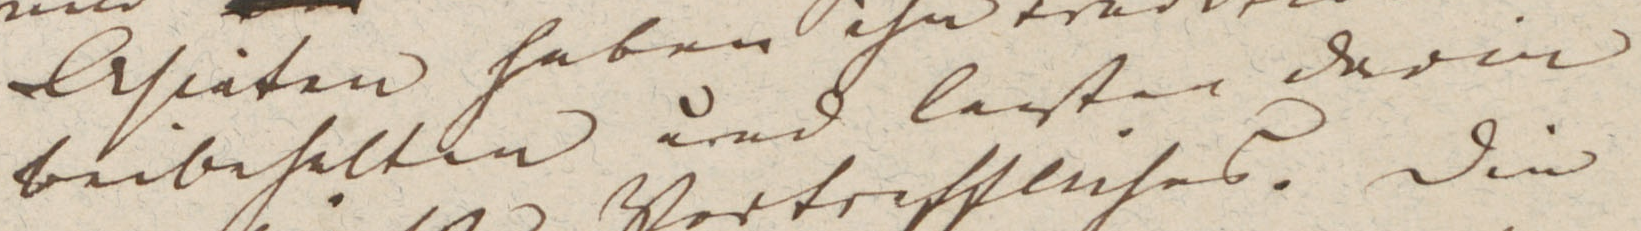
beibehalten und leisten darin
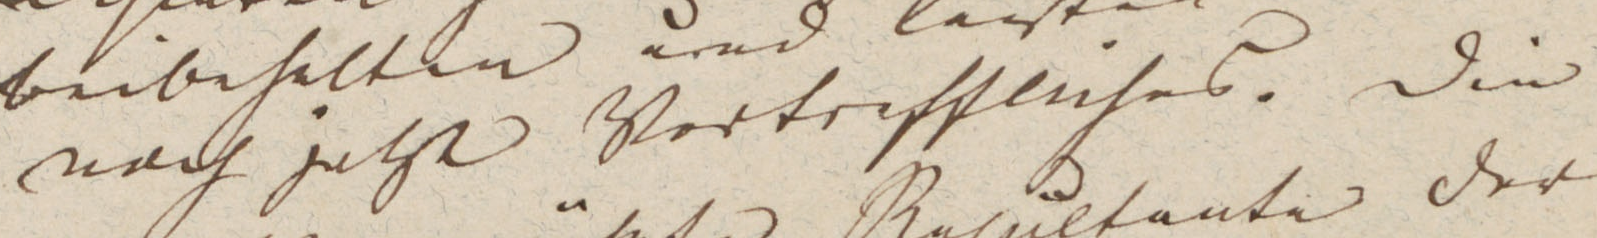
noch jetzt Vortreffliches. Die
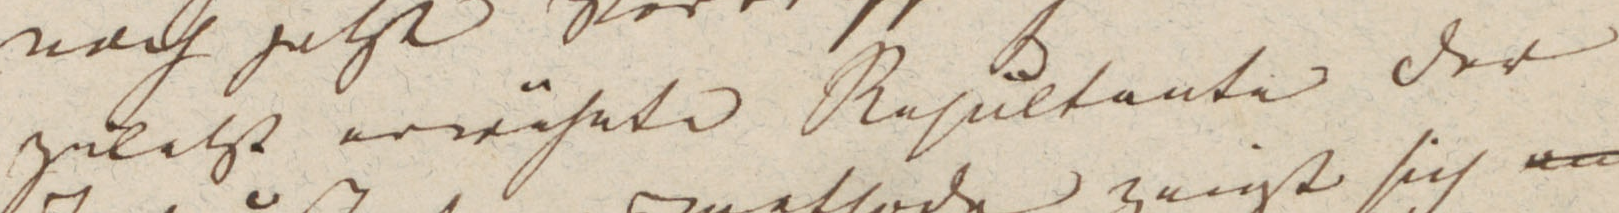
zuletzt erwähnte Resultante der
